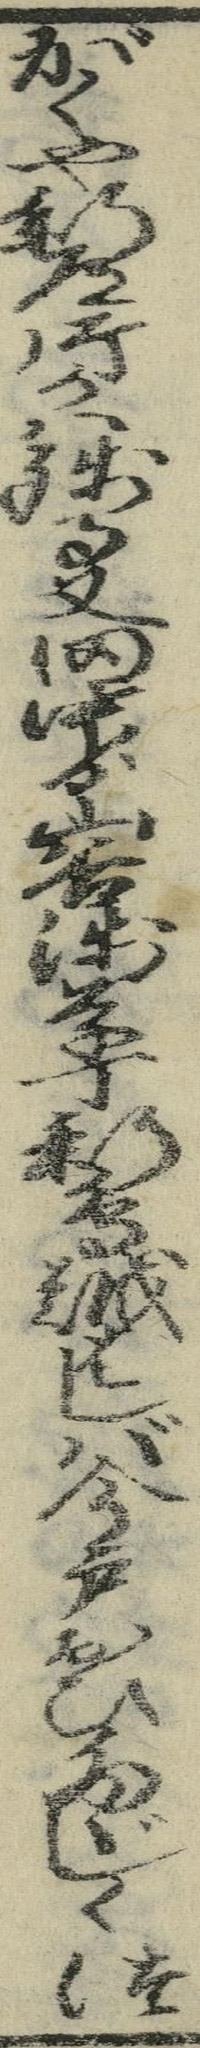がくや新道片かは残る又田中ゟ山谷浅草丁新鳥越はしば今戸おひたゞしくつ
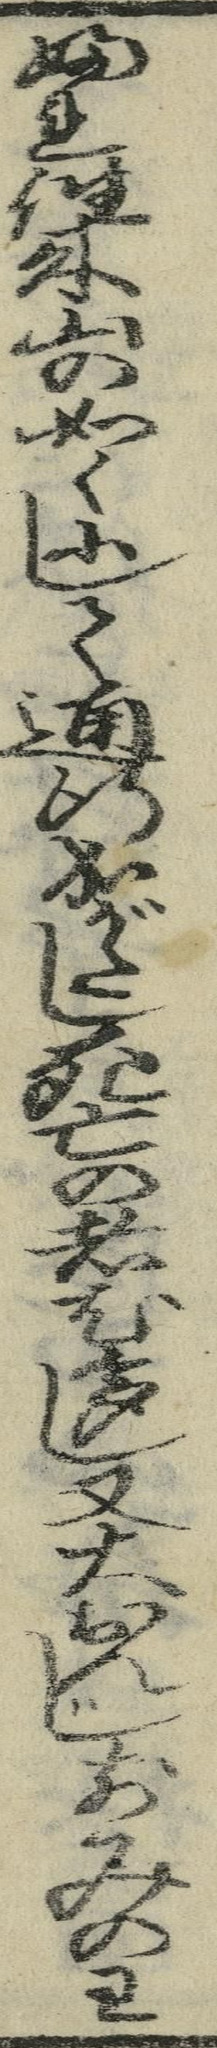ふれ往来山の如くにして通行成がたし死亡の者尤多し又大おんじ前みのわ
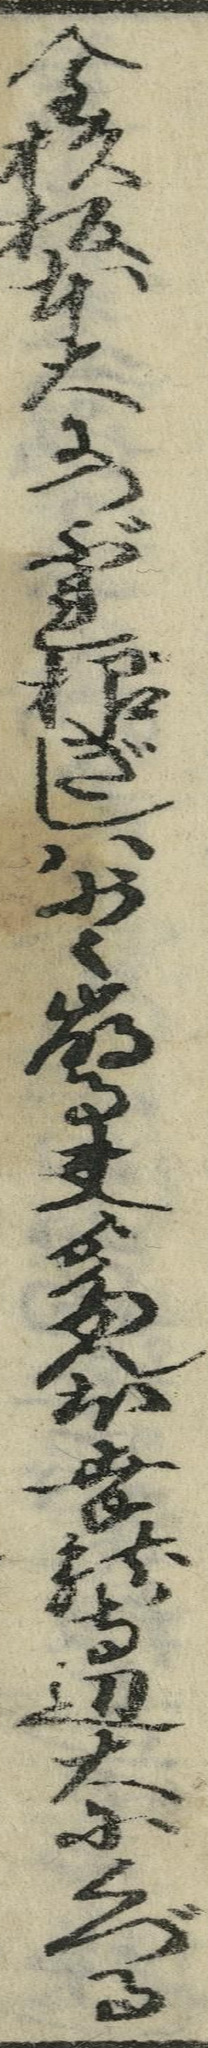金杉板本大につぶれ根ぎしは少々崩る夫ゟたんほ幸龍寺辺大にくづる
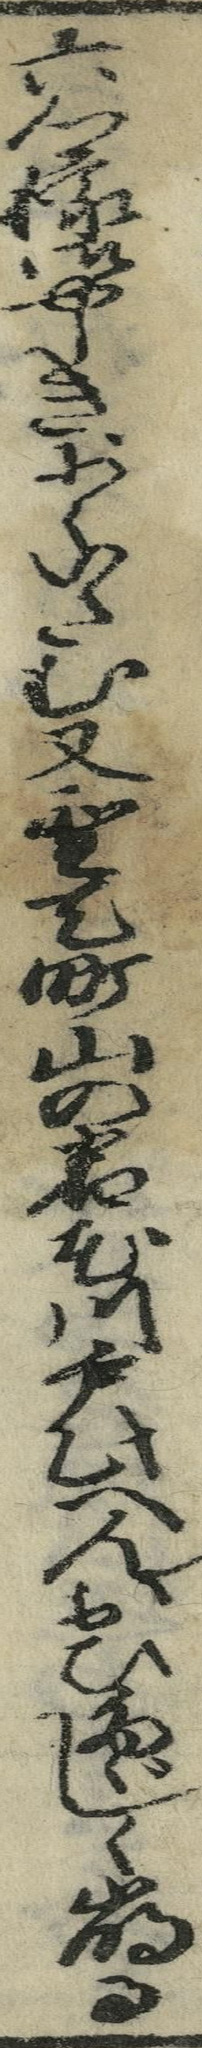六郷様御やしき少々いたむ又聖天町山の宿花川戸此へんおひたゞしく崩る
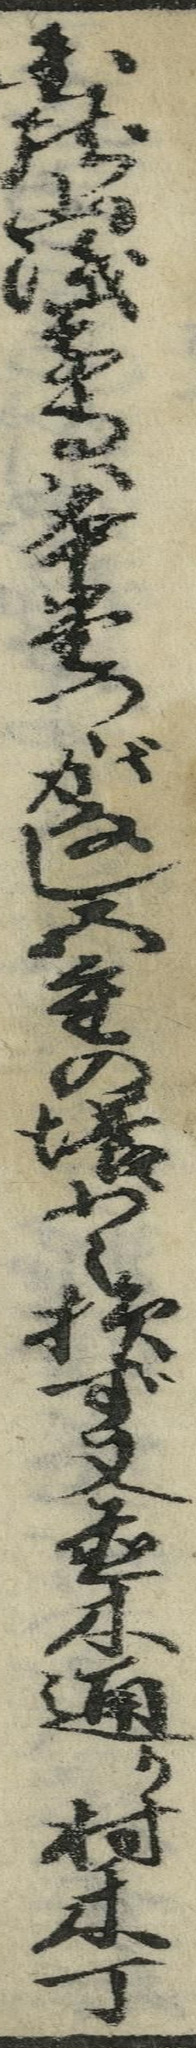金龍山浅草寺は本堂つゝがなし五重の塔少々損ず又並木通り村木丁
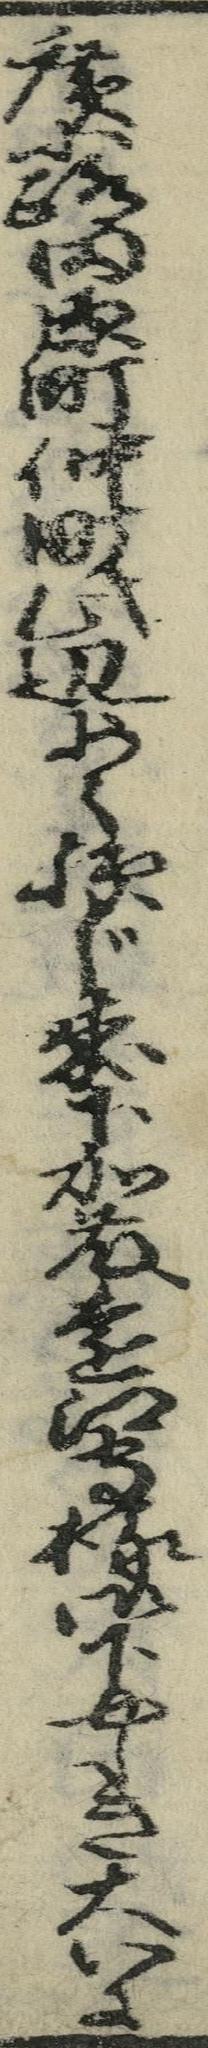広小路田原町仲町此辺少々損じ森下加藤遠江守様御下やしき大いに
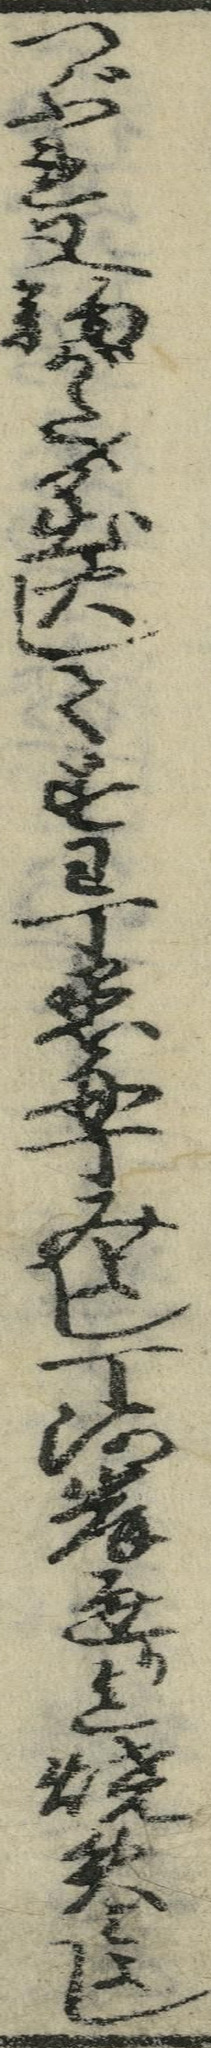つぶれ又駒がたゟ出火してすわ丁黒舟丁みよし丁河岸通り迄焼失みよし
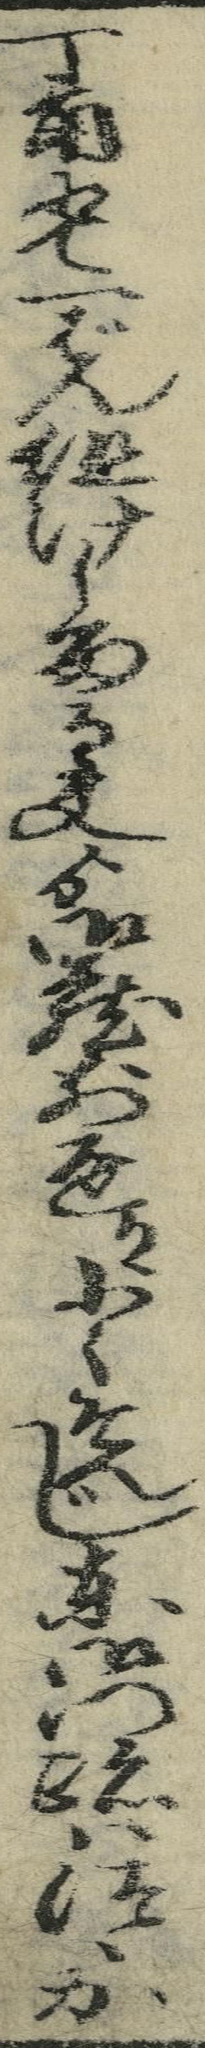丁角にて一ばん組けし留る夫ゟ御蔵前通り少々そんじ東御門跡はつゝか
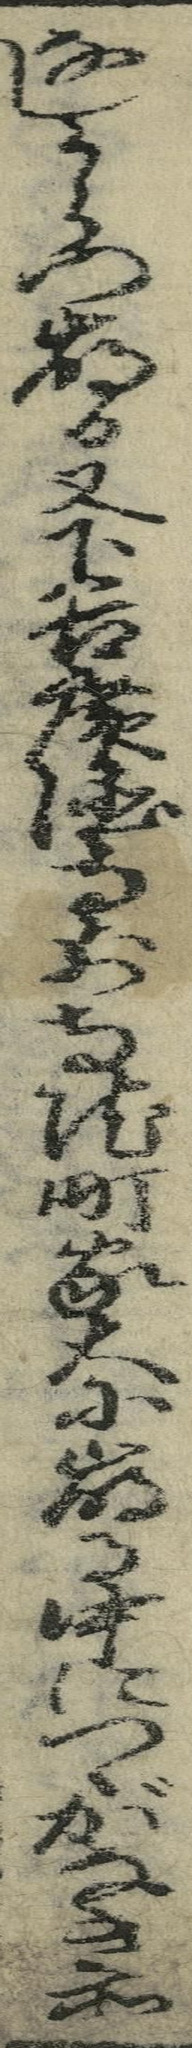なしから門崩る又下谷広徳寺前寺院町家大に崩る中につゝがなき所

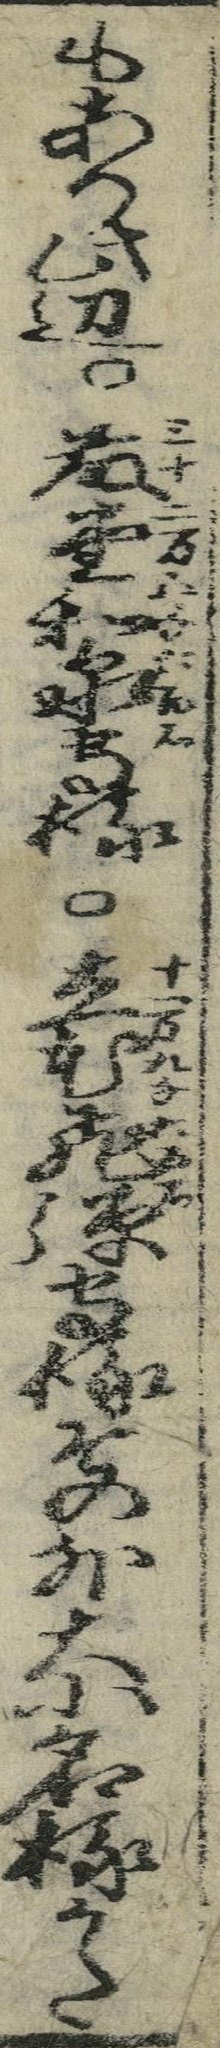もあり此辺○藤堂和泉守様○立花飛騨守様その外大小名様かた
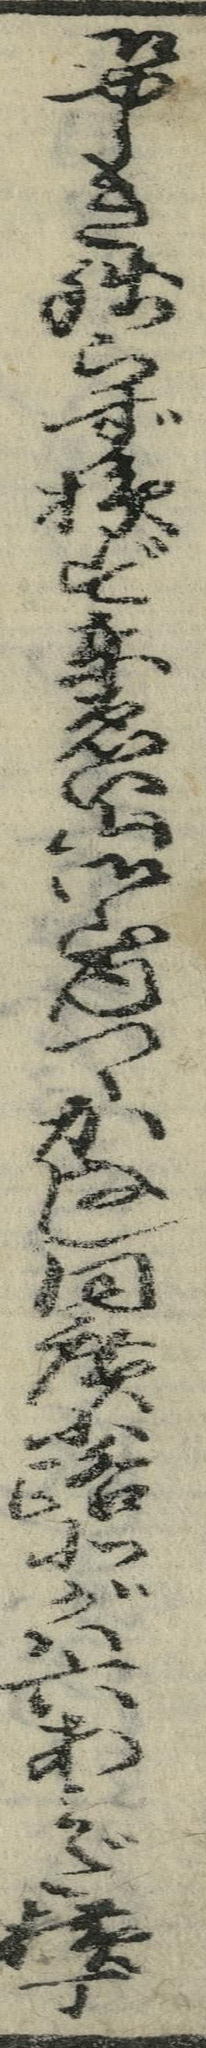御やしき残らず損ず東ゑい山御山内つゝかなし同広小路北がは六あかだ横丁
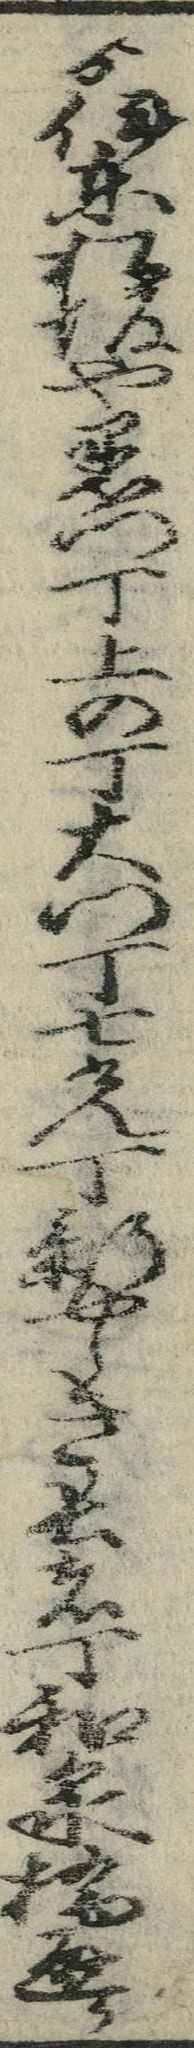ゟ伊東松坂や黒門丁上の丁大門丁七けん丁新やしき長者丁和泉橋通り
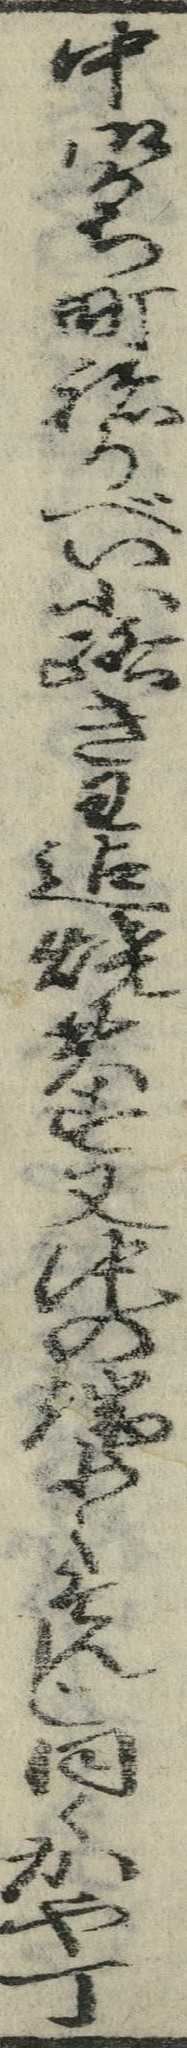中御かち町ねりべい小路きわ迄焼失す又池の端少々そんじ同くかや丁
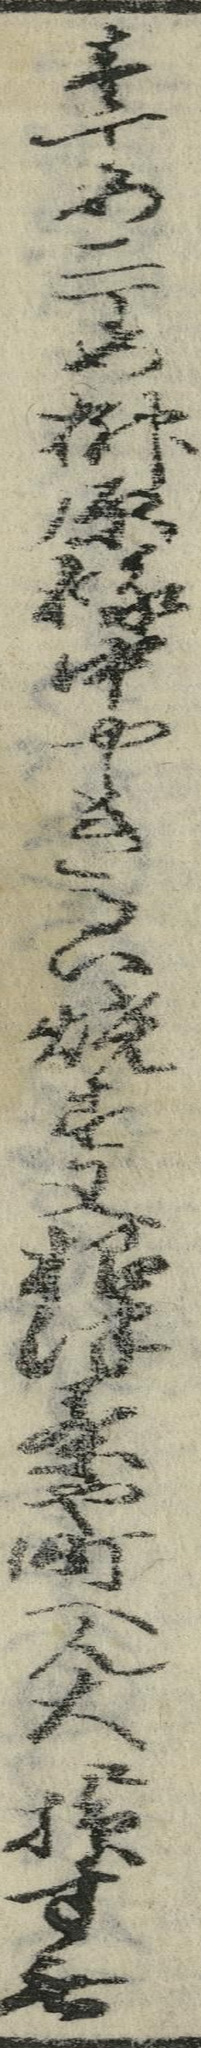壱丁め二丁め榊原様中やしきるい焼す又根津茶や町へん大に損す無
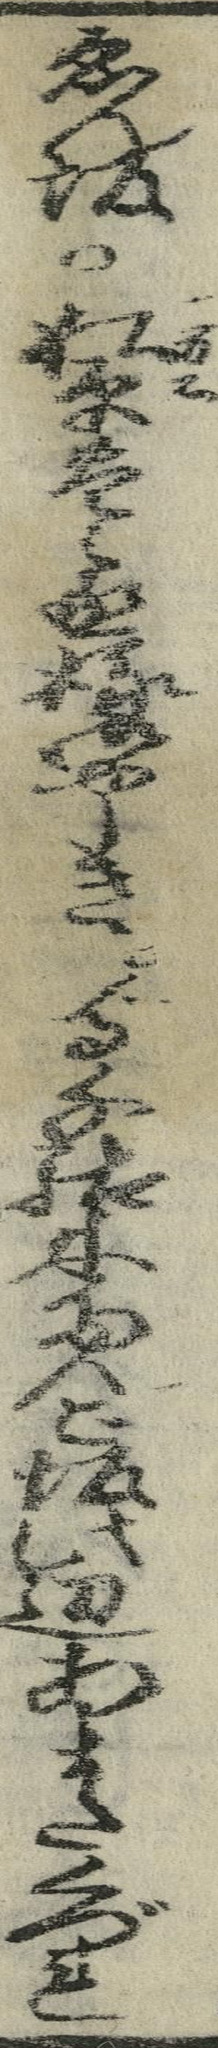ゑん坂〇松原豊之丞様御やしきる千駄木たんご坂此辺あまたくづれ
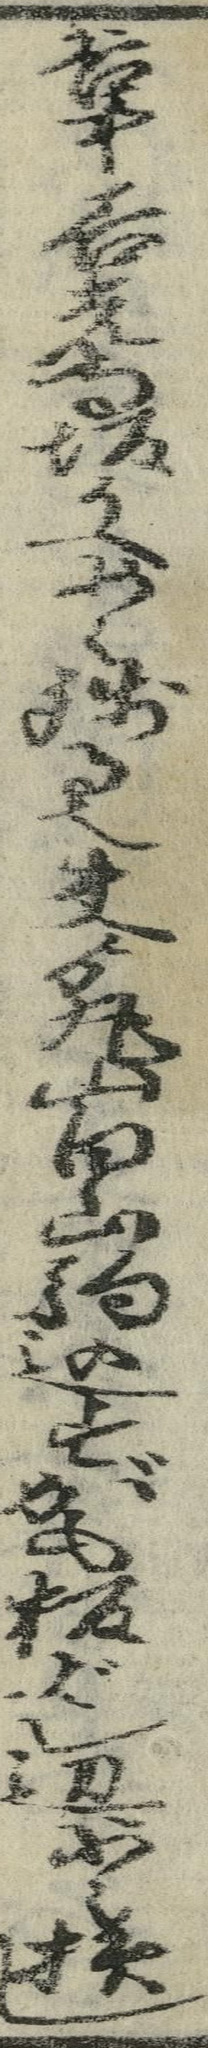谷中善光寺坂うへ少々残る也夫ゟ丸山白山駒込すがも板ばし辺少々損し
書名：安政息災記　全
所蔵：東京大学地震研究所図書室 Earthquake Research Institute Library, The University of Tokyo, JAPAN
